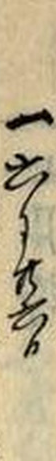一六月廿六日
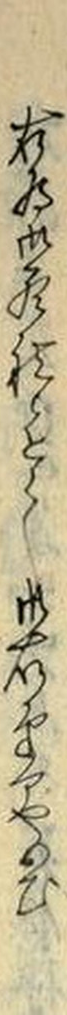右為御答礼被進之御右筆部やゟ出
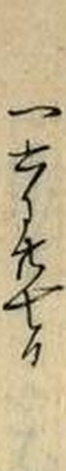一六月廿四日
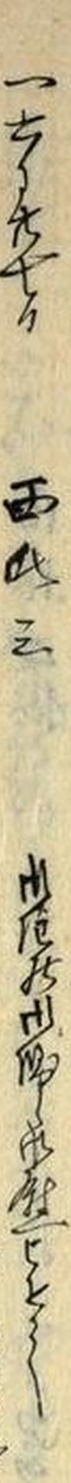一六月廿七日西瓜三御住居御側之御慰被進之
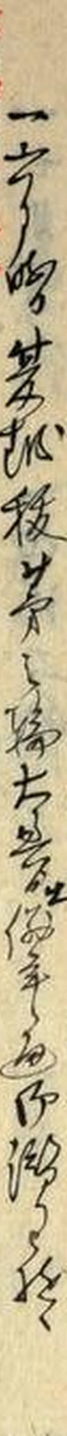一六月晦日夏越祓茅之輪大奥ゟ出例年之通御潜り被遊候
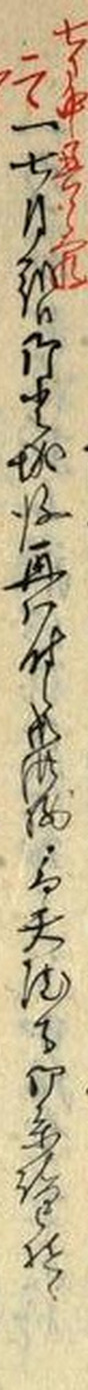一七月朔日御登城後再八時之御供揃ニ而天徳寺御参詣被遊候
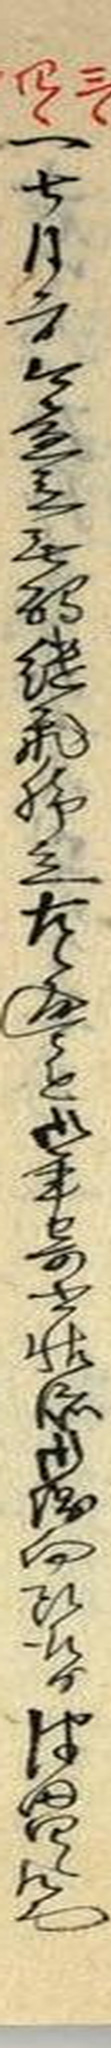一七月二日今昼立無触継飛脚立左之通被進御年寄書状添御側向頭取ゟ津田四郎左衛門
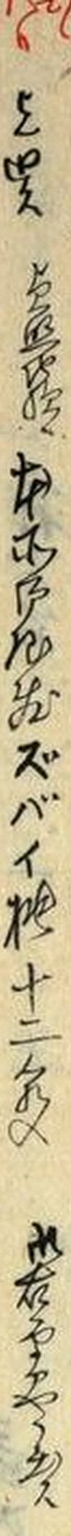貞照院様へ本所御屋敷ズバイ桃十二箱入御右筆部やへ出ス
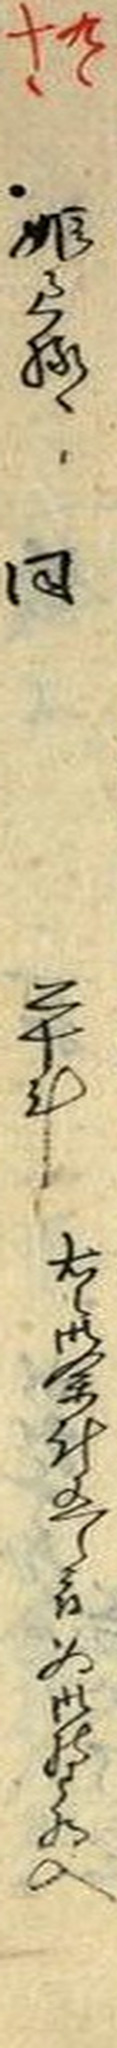姫君様へ同二十斗右之御余計有之候付為御持被為入
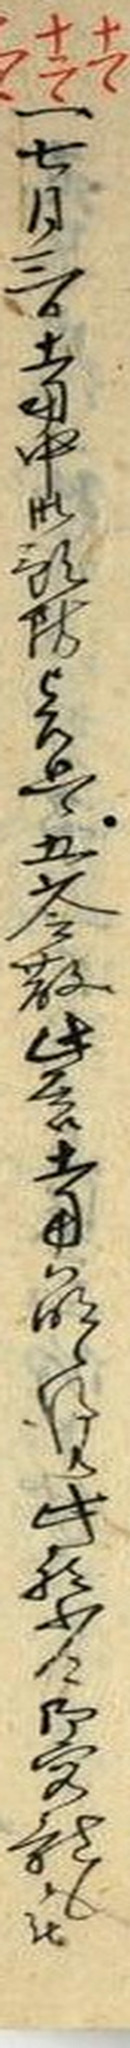一七月三日土用中御予防被召上五苓散此節土用ハ明候得共此程少々御容軆も被

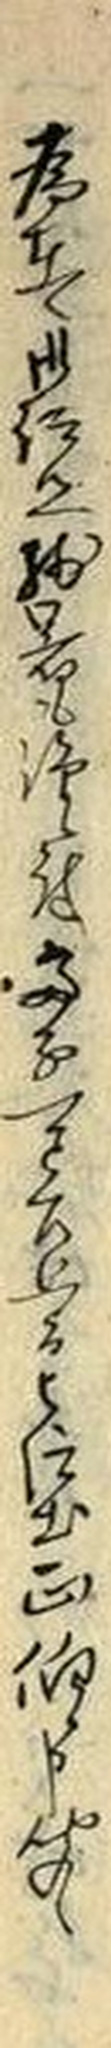為在候御仰且残暑も強候ニ付当分可被召上旨被仰出正伯へ申聞候
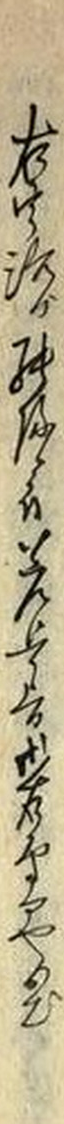右宇治ゟ罷帰候ニ付差上候旨御右筆部やゟ出
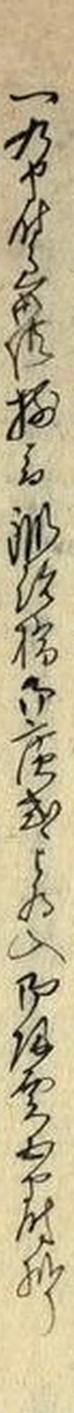一九半時過御供揃ニ而鍛冶橋御広式へ被為入御帰殿五半時掛り
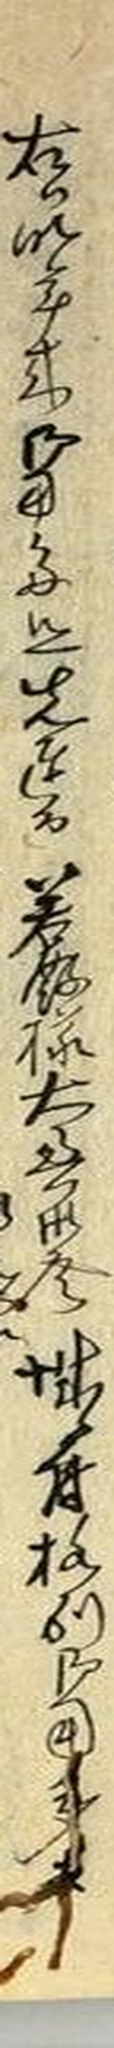右ハ昨年來御用多且先達而若殿様大奥御登城ニ付格別御用多相
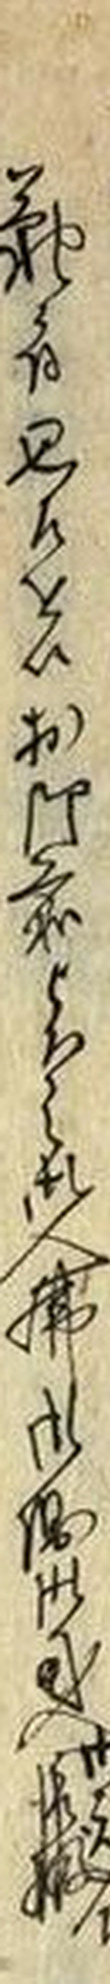勤候ニ付思召を以於御前被下之御人払御側御用人御取合
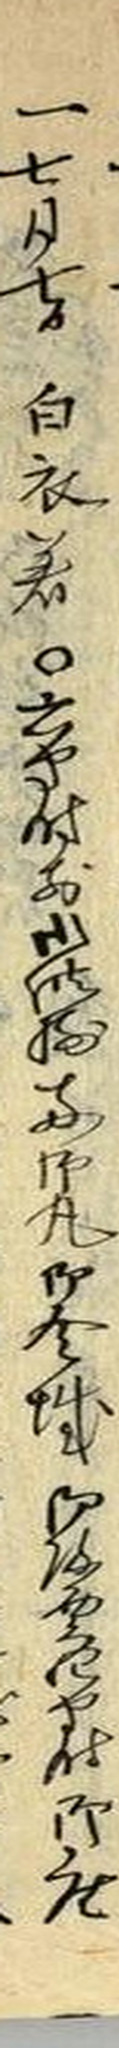一七月七日白衣着○六半時前御供揃両御丸御登城御帰殿四半時御座
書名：少傅日録抄（斉承付側向頭取日記、在府）
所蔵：福井県文書館 Fukui Prefectural Archives
